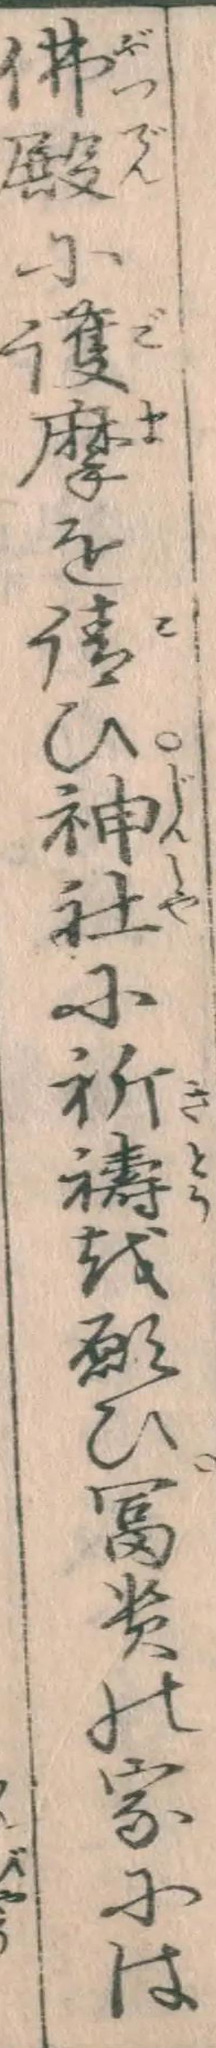仏殿に護摩を請ひ。神社に祈祷を願ひ。富貴の家には
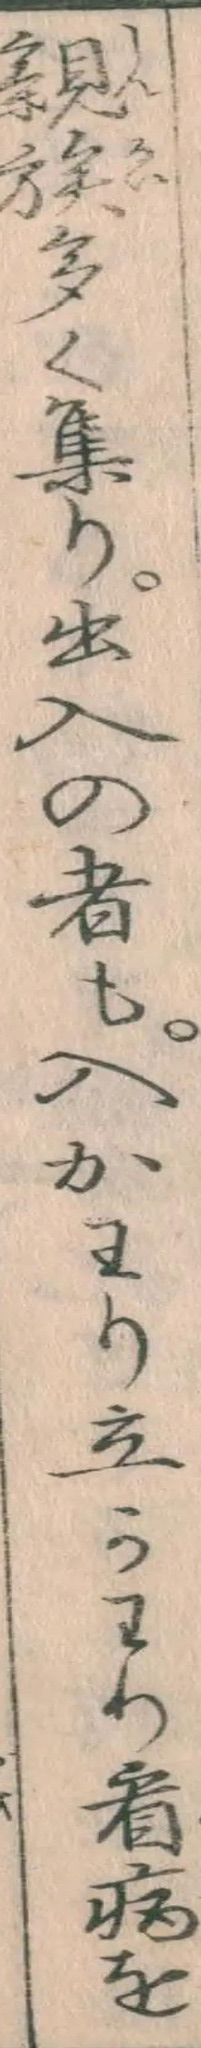親類多く集り。出入の者も。入かわり立ちかわり看病を
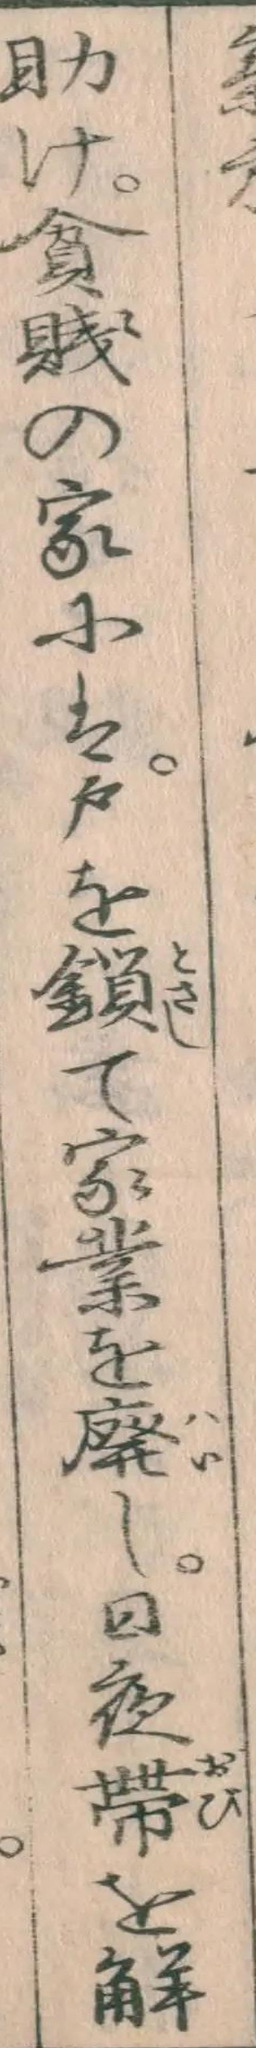助け。貧賤の家には。戸を鎖て家業を廃し。日夜帶を解
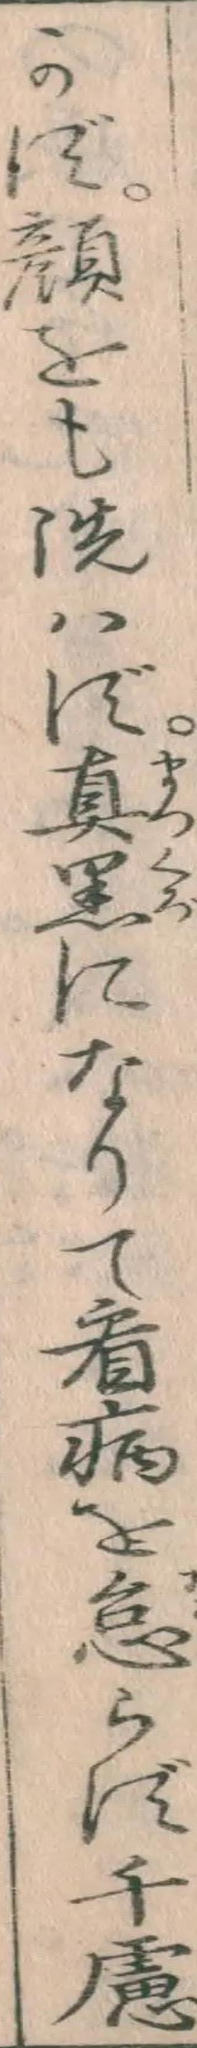かず。顔をも洗はず。真黒になりて看病を怠らず。千慮
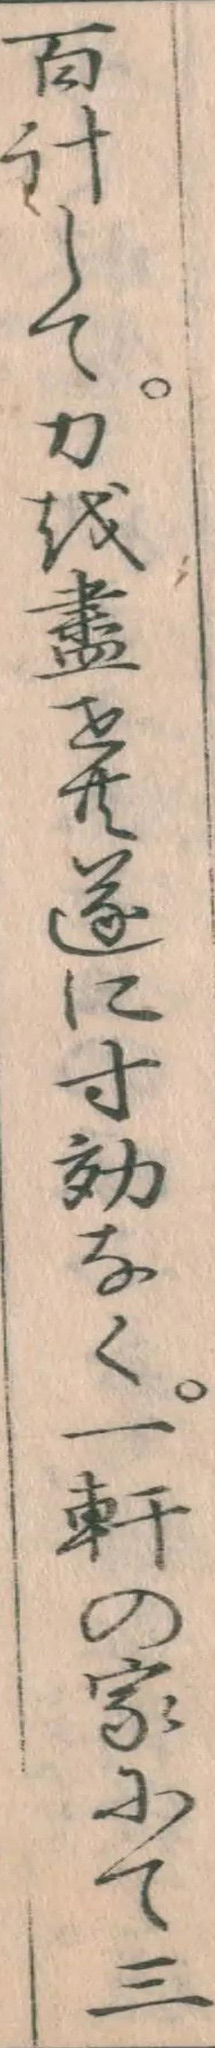百計して。力を尽せ共遂に寸効なく。一軒の家にて三
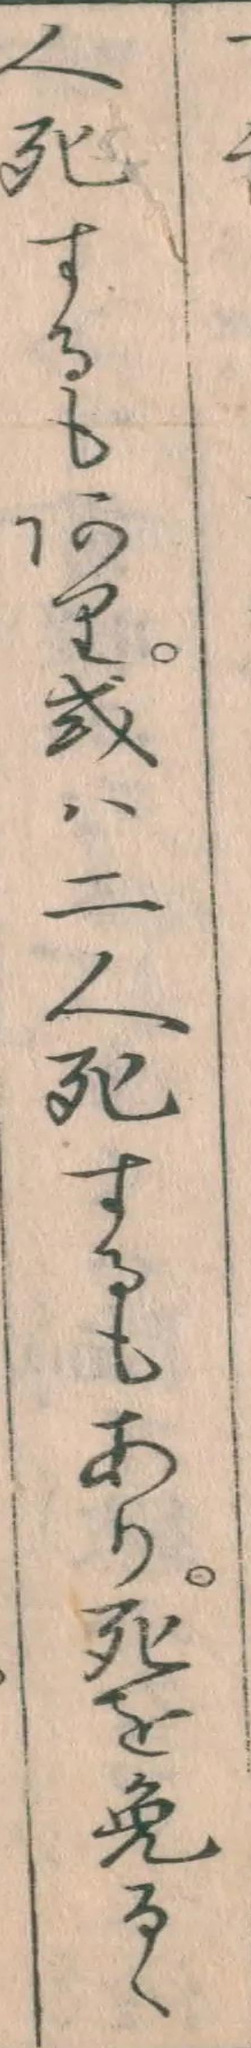人死するもあり。或は二人死するもあり。死を免るゝ
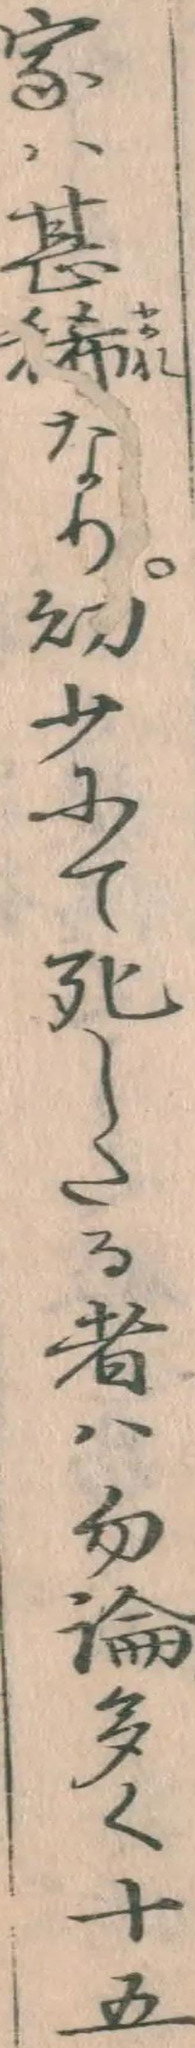家は甚稀なり。幼少にて死したる者は勿論。多く十五
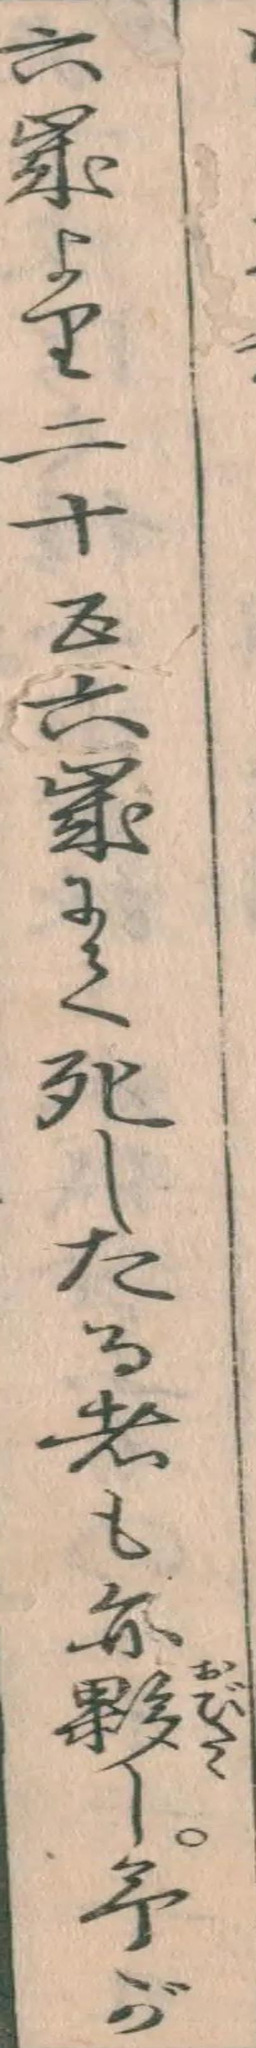六歳より二十五六歳にて死したる者も亦夥し。予が
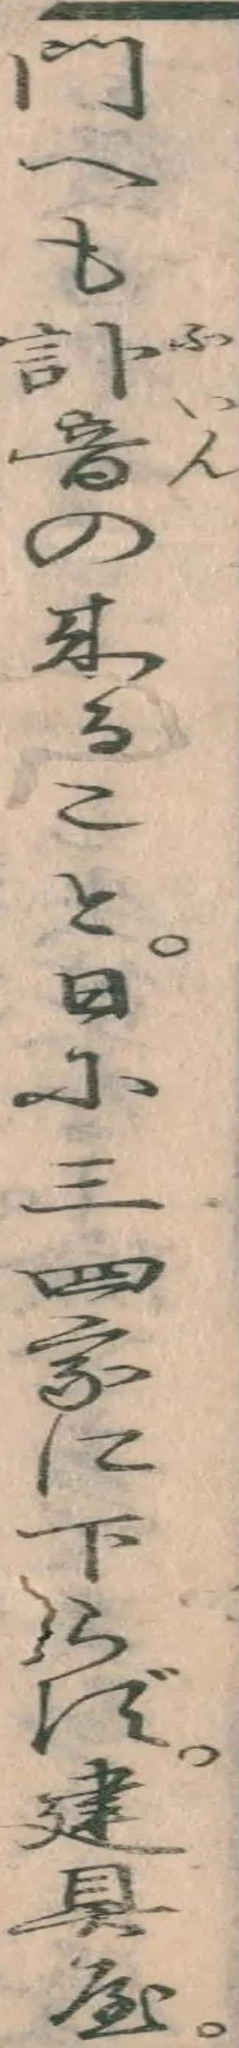門へも訃音の来ること。日に三四家に下らず。建具屋。
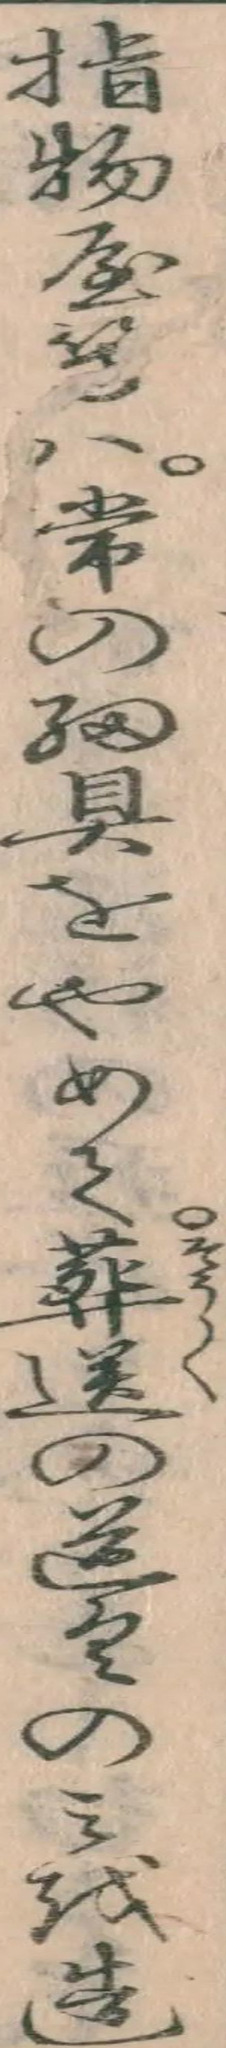指物屋等は。常の細具をやめて。葬送の道具のみを造
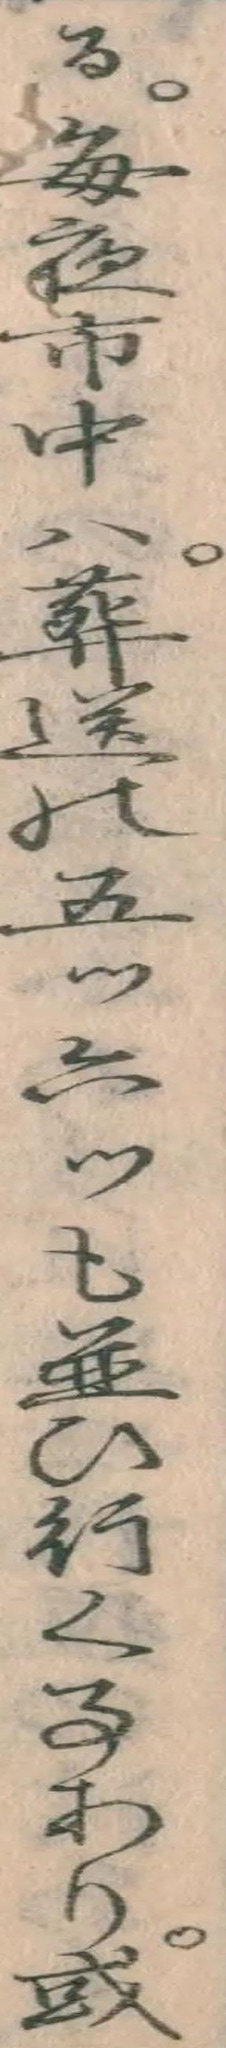る。毎夜市中は。葬送の五ツ六ツも並ひ行く事あり。或
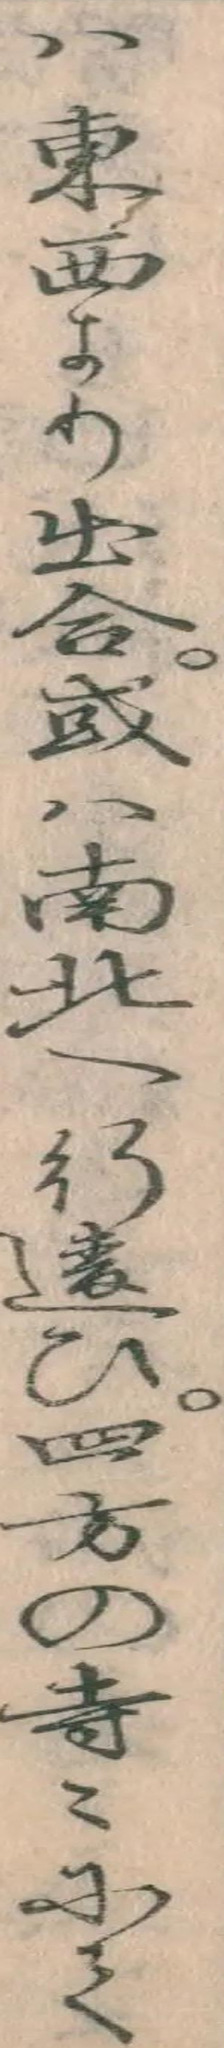は東西より出合。或は南北へ行違ひ。四方の寺々にて
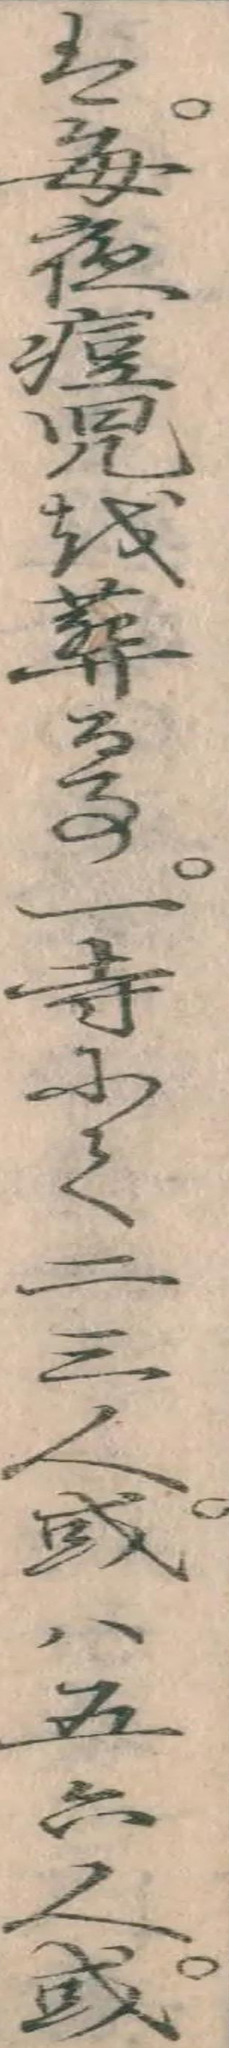は。毎夜痘児を葬る事。一寺にて二三人。或は五六人。或
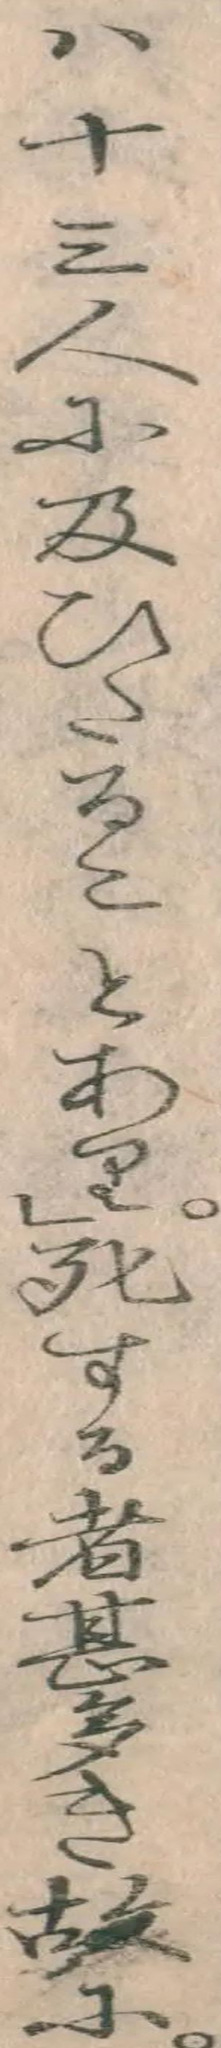は十三人に及ひたることあり。」死する者甚多き故に。
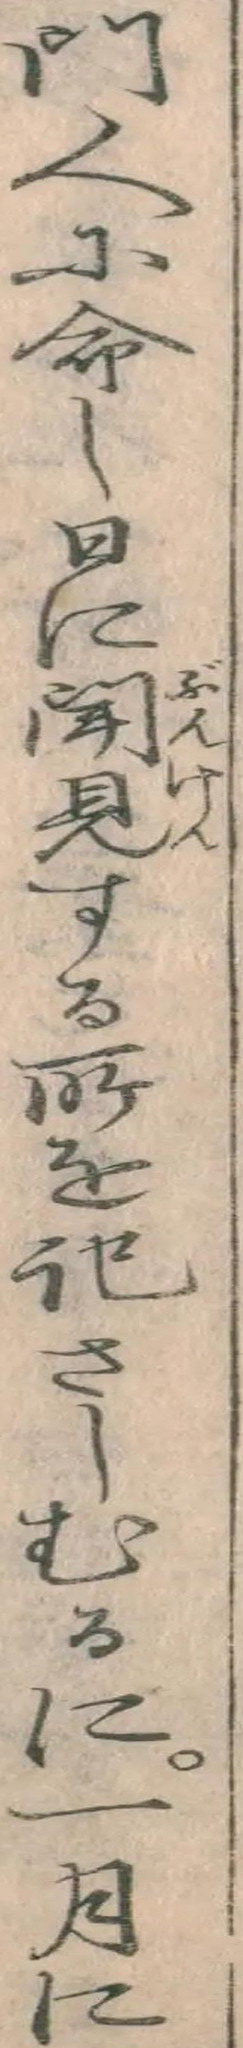門人に命し日に聞見する所を記さしむるに。一月に
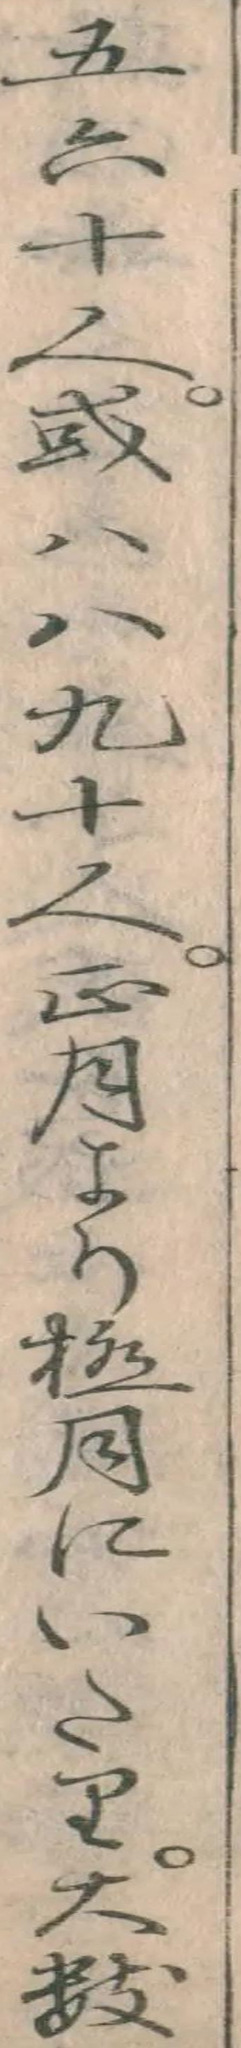五六十人。或は八九十人。正月より極月にいたり。大数
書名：種痘活人十全辯
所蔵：国立国会図書館 National Diet Library, JAPAN
